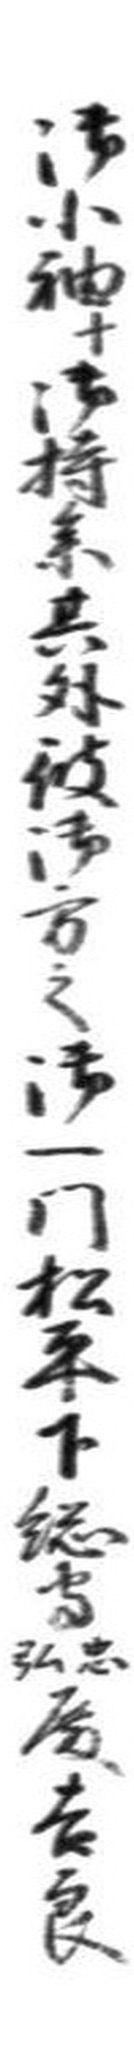御小袖十御持参其外彼御方之御一門松平下総守忠弘殿吉良

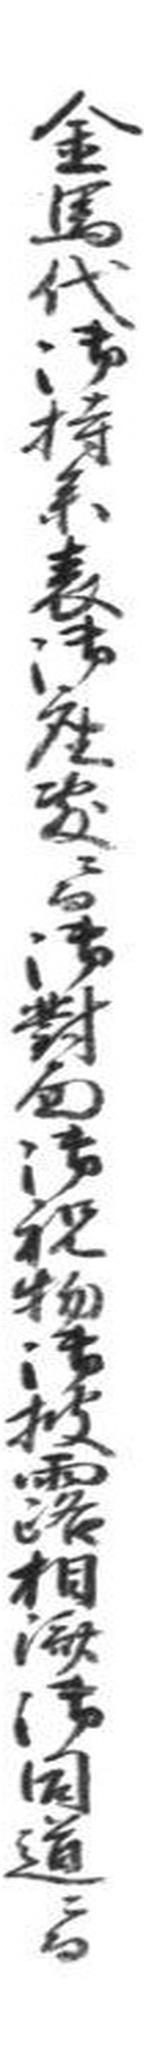金馬代御持参表御座敷ニ而御対面御祝物御披露相済御同道ニ而
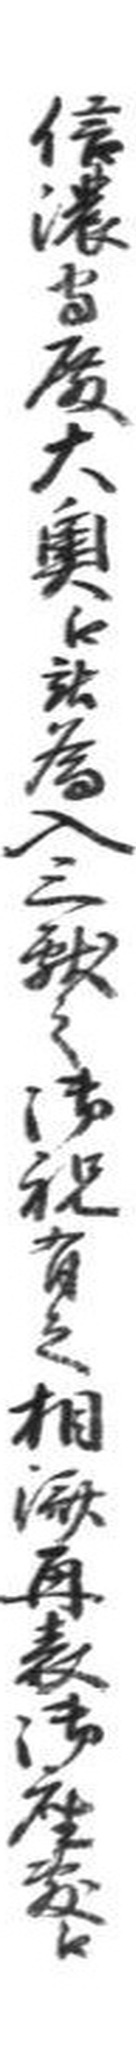信濃守殿大奥江被為入三献之御祝有之相済再表御座敷江
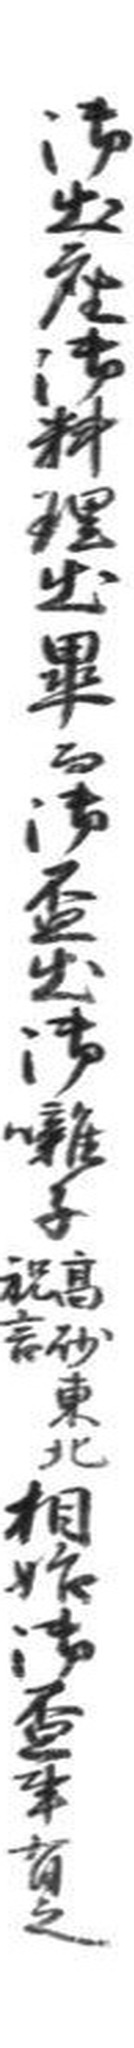御出座御料理出畢而御盃出御囃子高砂東北祝言相始御盃事有之
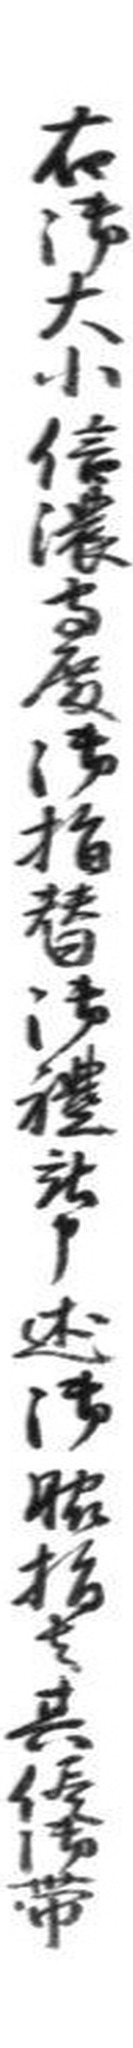右御大小信濃守殿御指替御礼被申述御脇指は其儘御帯
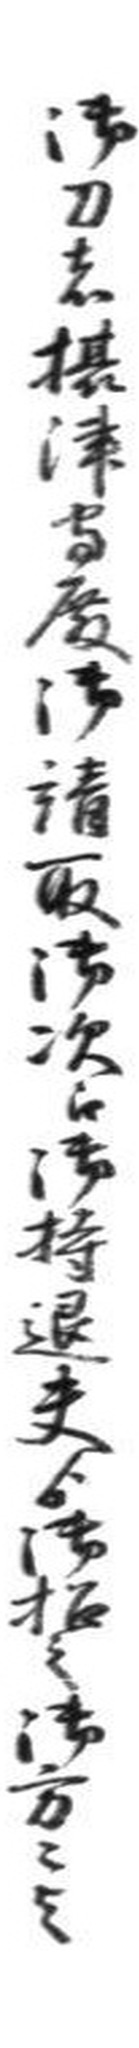御刀者摂津守殿御請取御次江御持退夫ゟ御招之御方々と
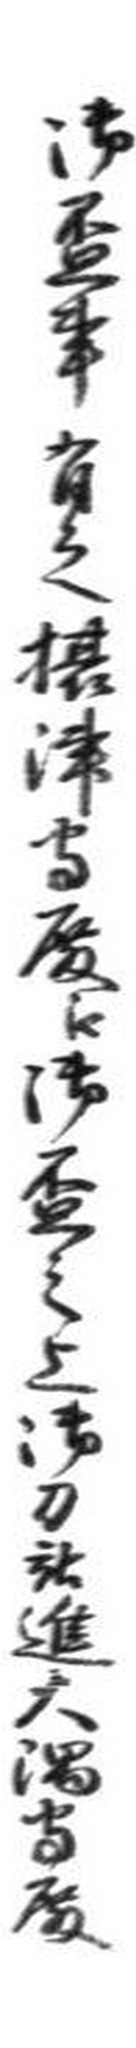御盃事有之摂津守殿江御盃之上御刀被進大隅守殿
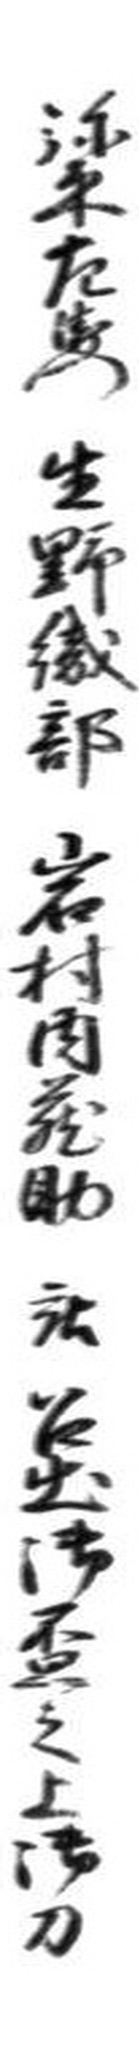弥平左衛門生野織部岩村内蔵助被召出御盃之上御刀
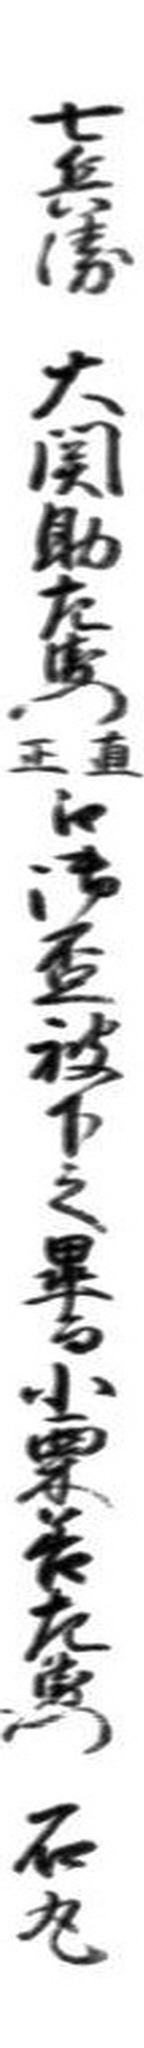七兵衛大関助左衛門直正江御盃被下之畢而小栗善左衛門石丸

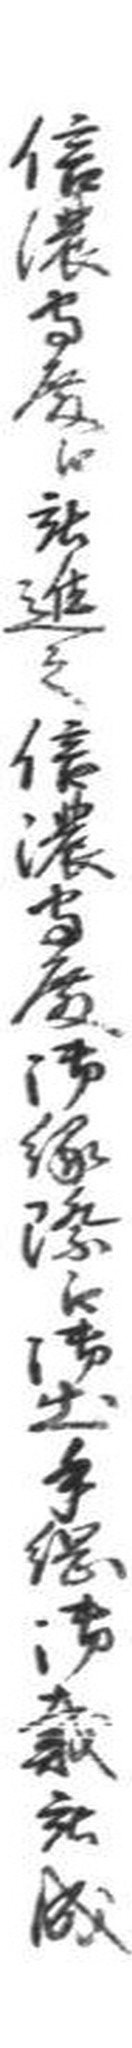信濃守殿江被進之信濃守殿御縁際江御出手綱御戴被成
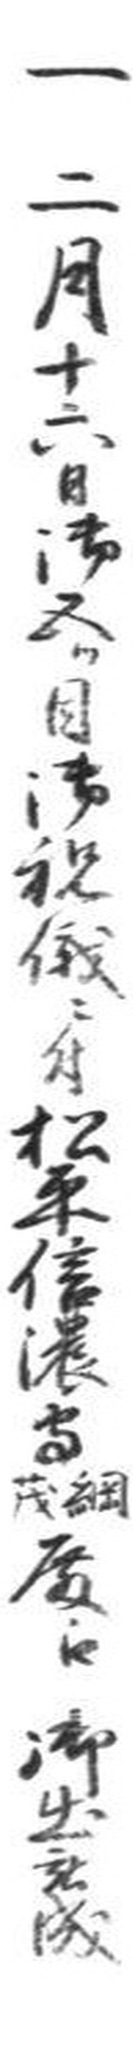一二月十六日御五ツ目御祝儀ニ付松平信濃守綱茂殿江御出被成
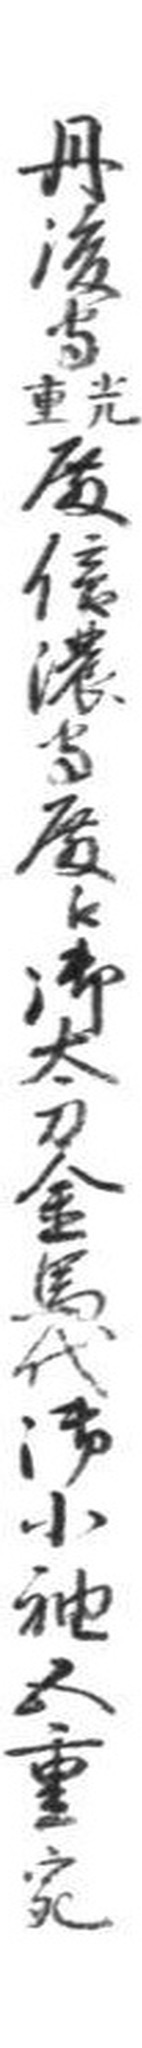丹後守光重殿信濃守殿江御太刀金馬代御小袖五重宛
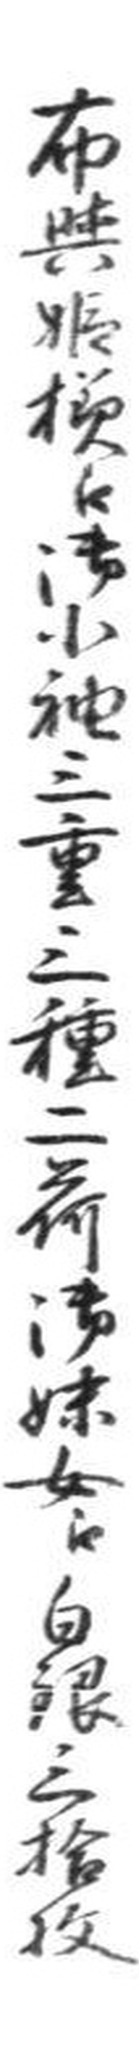布与姫様江御小袖三重三種二荷御妹女江白銀三拾枚
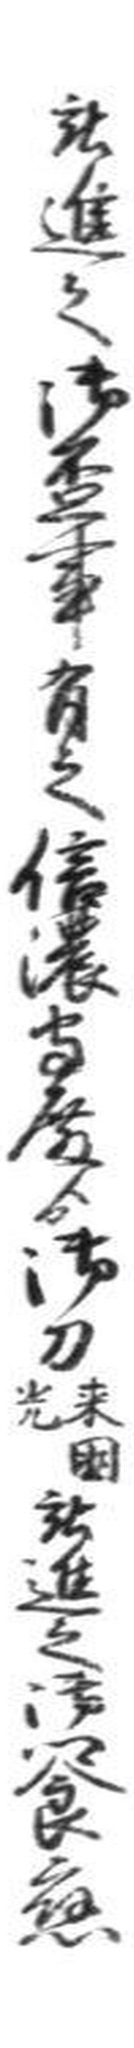被進之御盃事有之信濃守殿ゟ御刀来国光被進之御饗応
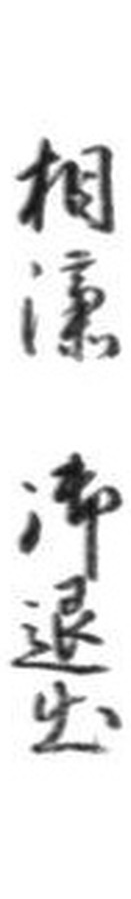相済御退出
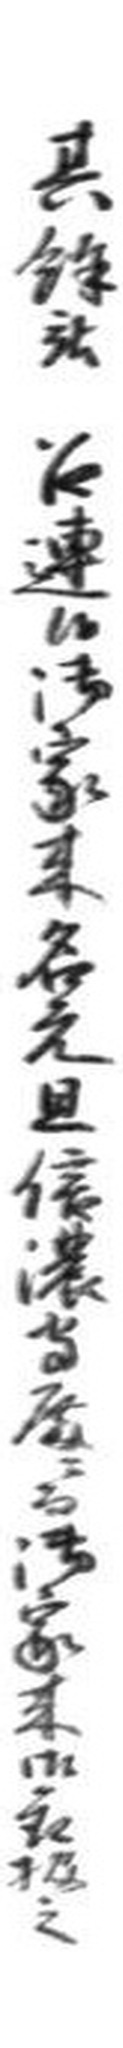其餘被召連候御家来名元旦信濃守殿ニ而御家来御取扱之
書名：家譜 八 光通公 従寛文十年到同十二年
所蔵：福井県文書館 Fukui Prefectural Archives
